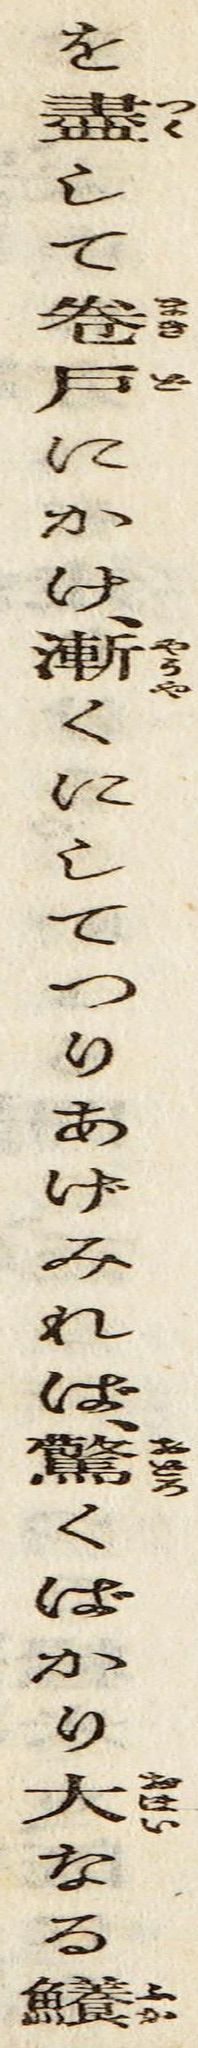を尽して巻戸にかけ、漸くにしてつりあげみれば、驚くばかり大なる鱶
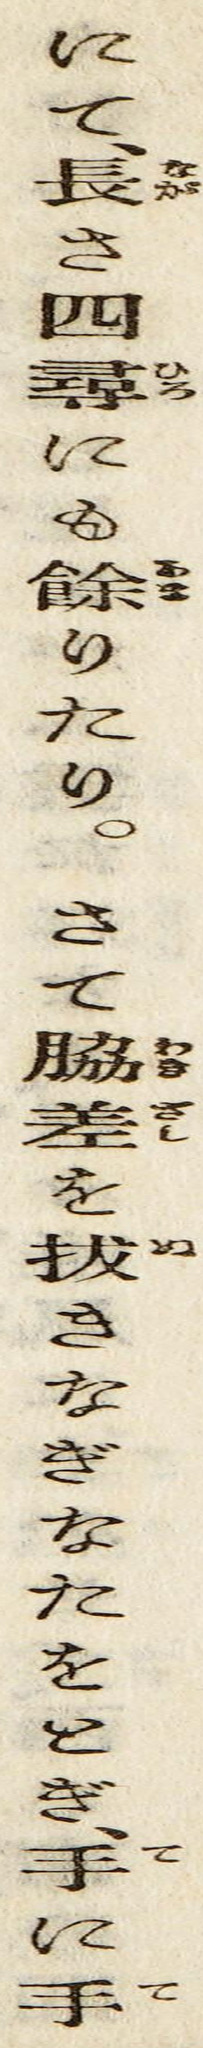にて、長さ四尋にも余りたり。さて脇差を抜きなぎなたをとぎ、手に手
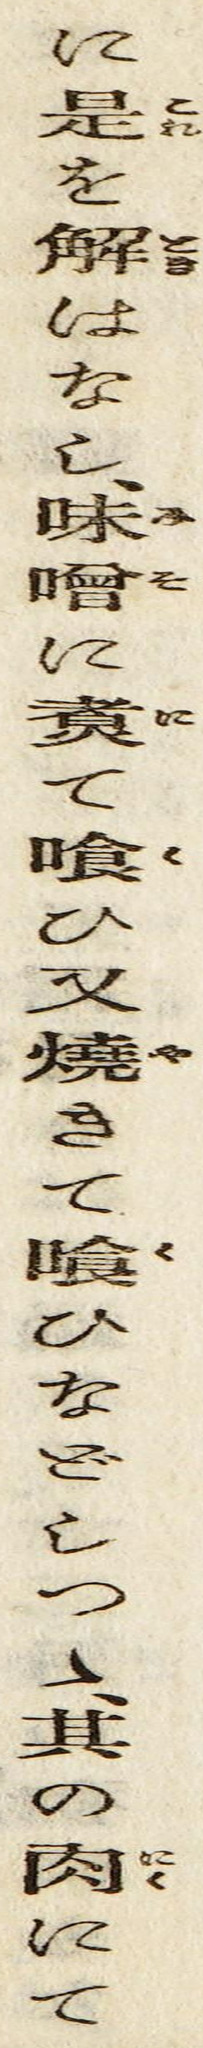に是を解はなし、味噌に煮て喰ひ又焼きて喰ひなどしつゝ、其の肉にて
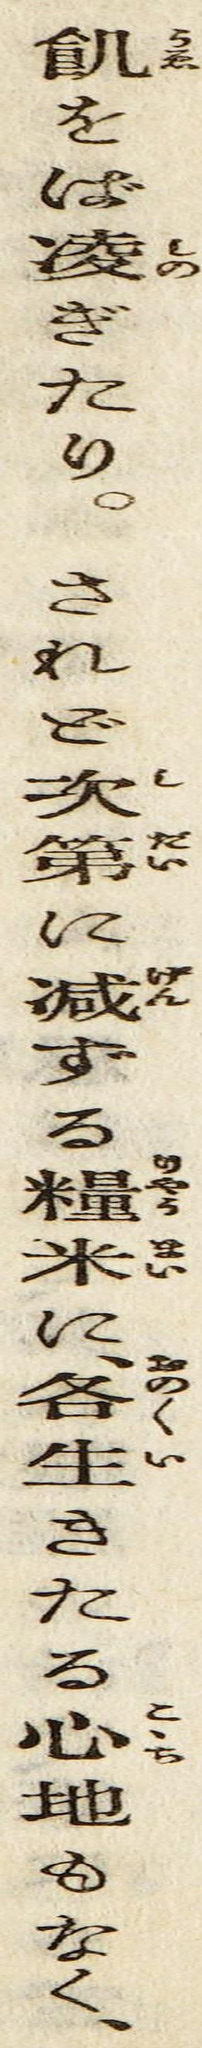飢をば凌ぎたり。されど次第に減ずる糧米に、各生きたる心地もなく、

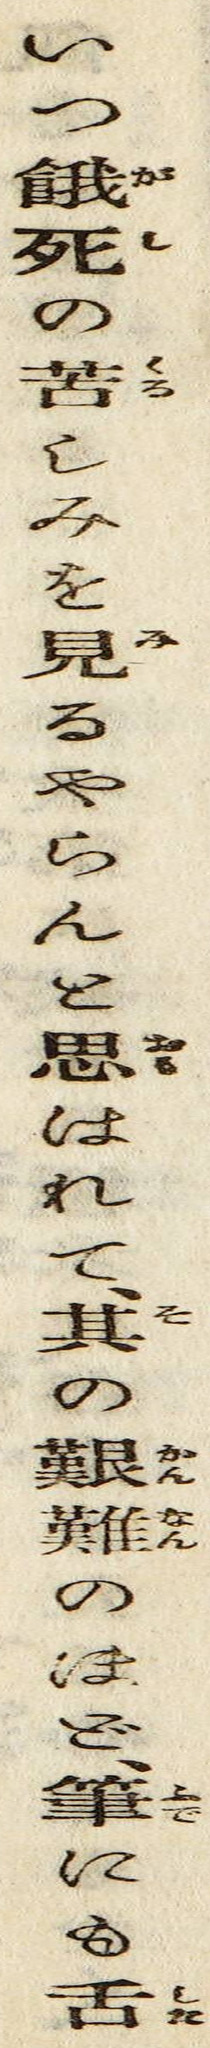いつ餓死の苦しみを見るやらんと思はれて、其の艱難のほど、筆にも舌
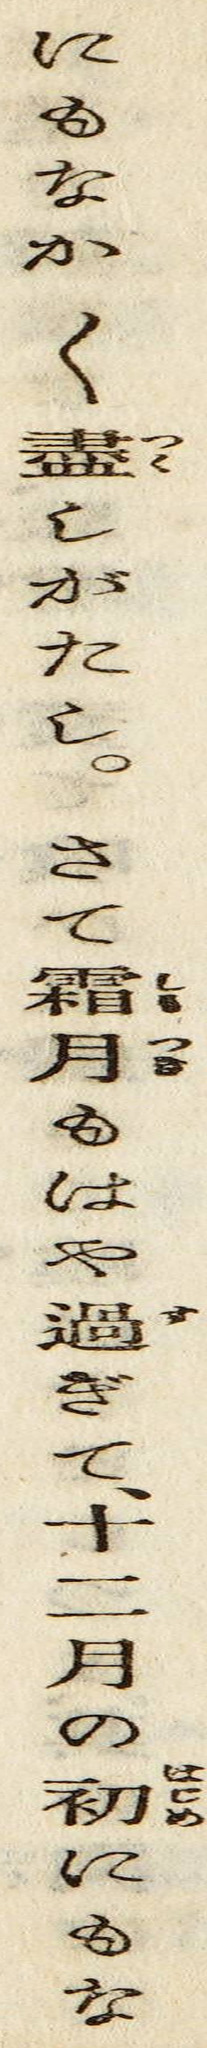にもなか〳〵尽しがたし。さて霜月もはや過ぎて、十二月の初にもな
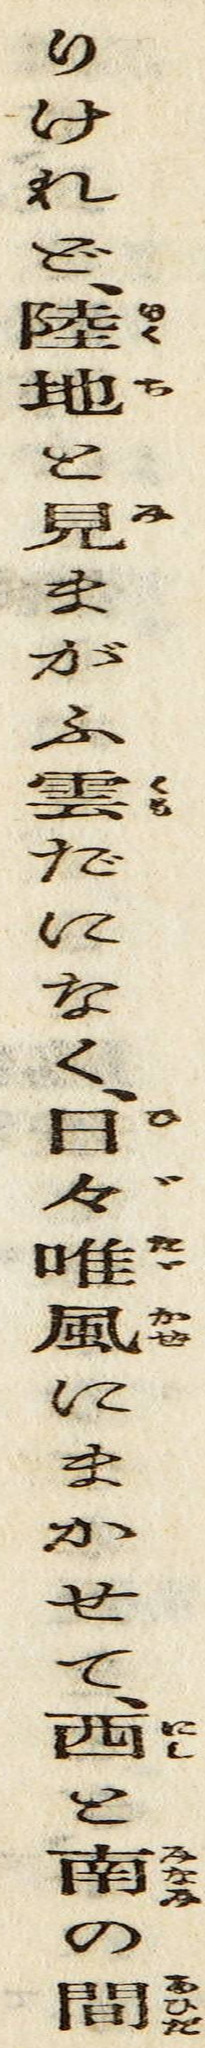りけれど、陸地と見まがふ雲だになく、日々唯風にまかせて、西と南の間
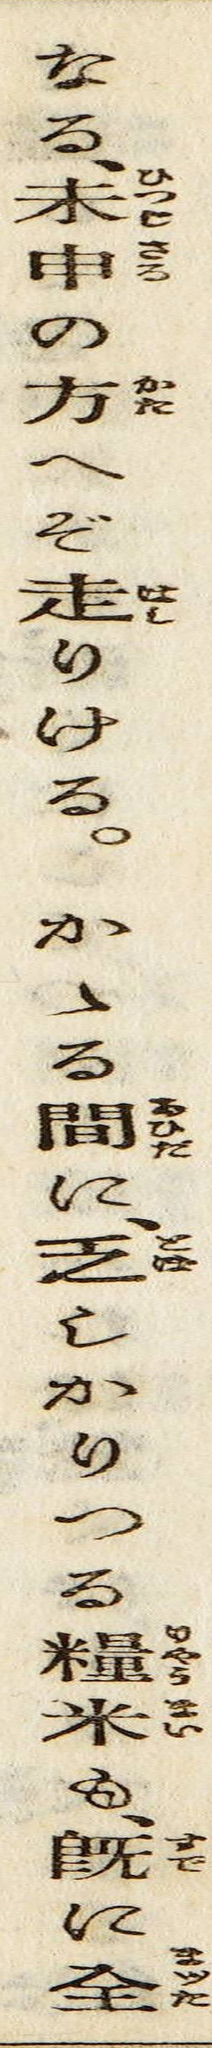なる、未申の方へぞ走りける。かゝる間に、乏しかりつる糧米も、既に全
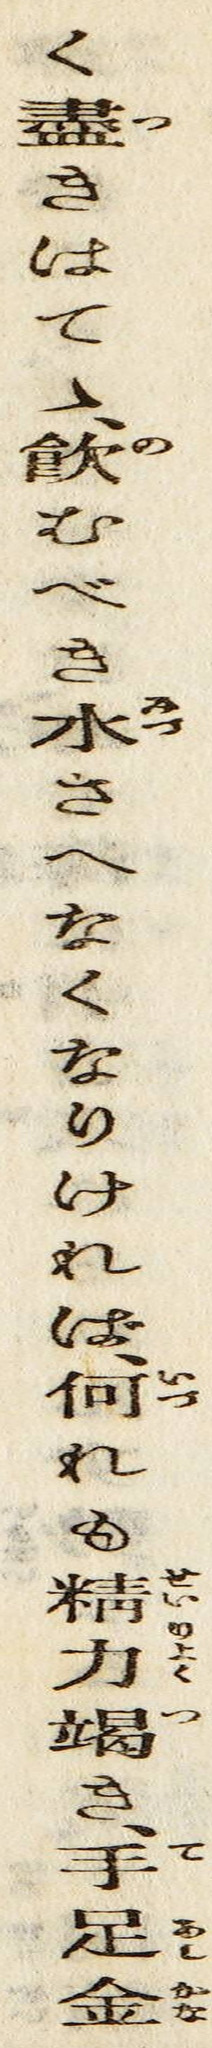く尽きはてゝ、飲むべき水さへなくなりければ、何れも精力竭き、手足金
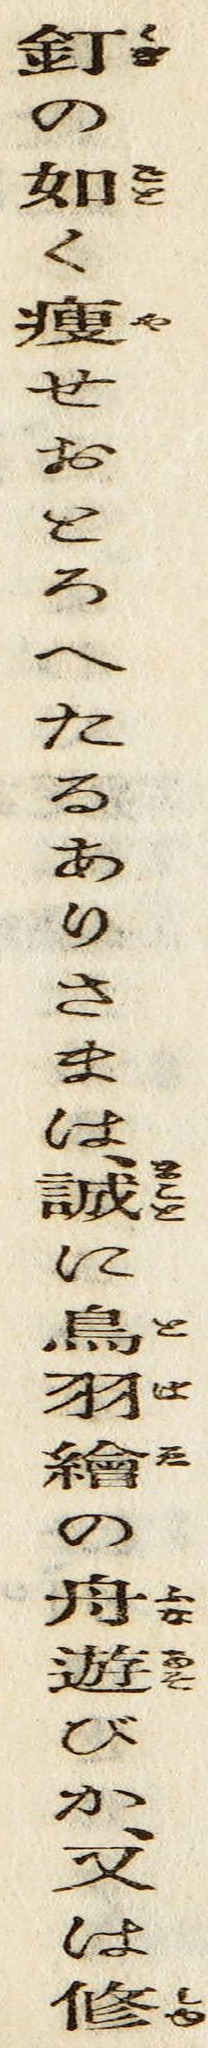釘の如く痩せおとろへたるありさまは、誠に鳥羽絵の舟遊びか、又は修
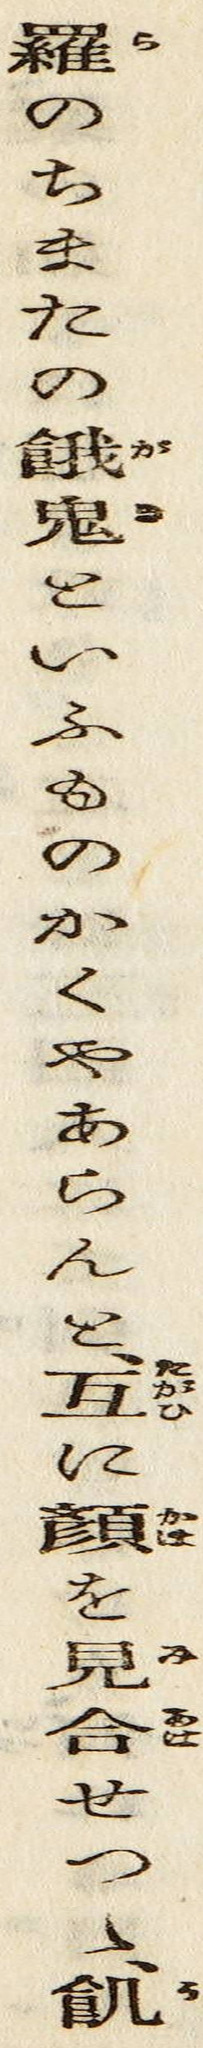羅のちまたの餓鬼といふものかくやあらんと、互に顔を見合せつゝ、飢
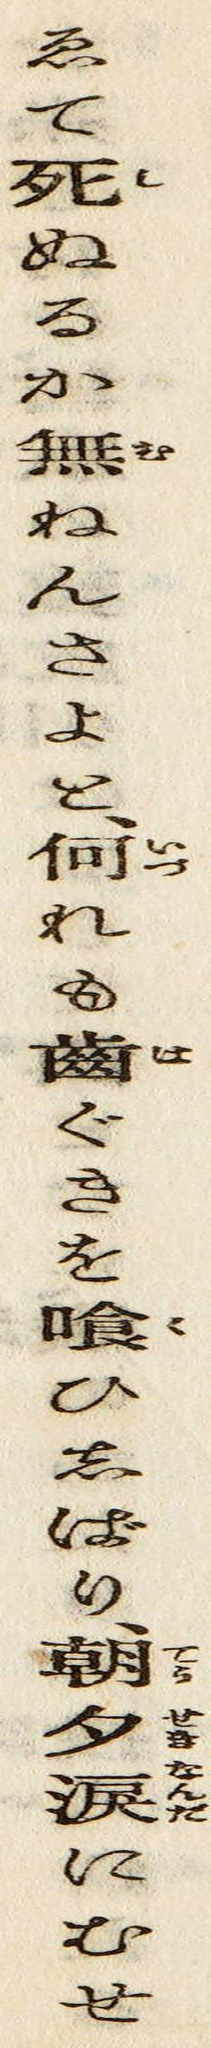ゑて死ぬるか無ねんさよと、何れも歯ぐぎを喰ひしばり、朝夕涙にむせ
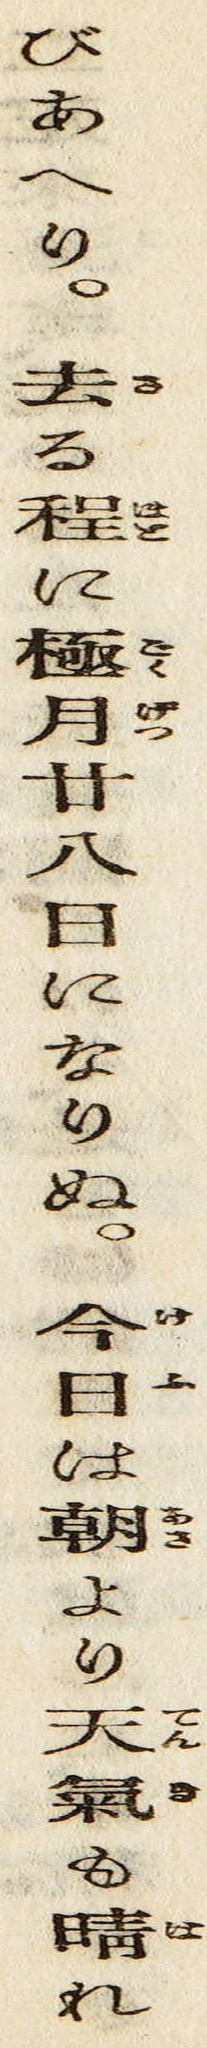びあへり。去る程に極月廿八日になりぬ。今日は朝より天気も晴れ
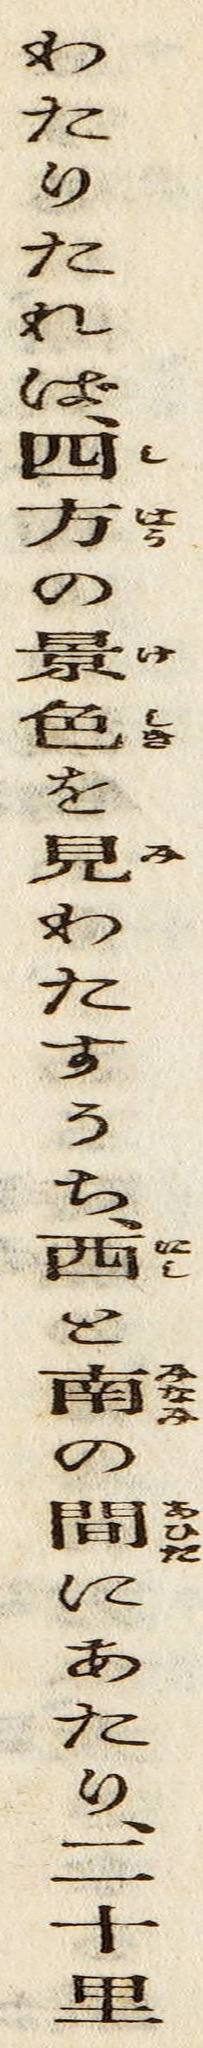わたりたれば、四方の景色を見わたすうち、西と南の間にあたり、二十里
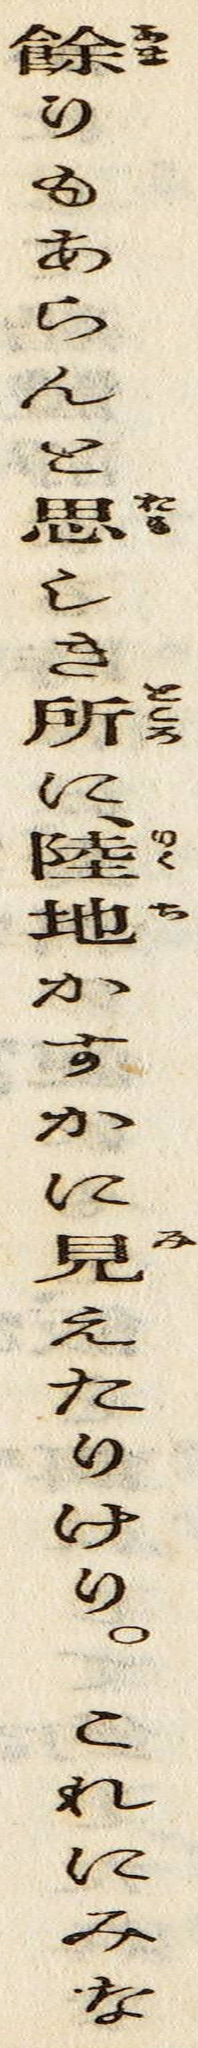余りもあらんと思しき所に、陸地かすかに見えたりけり。これにみな
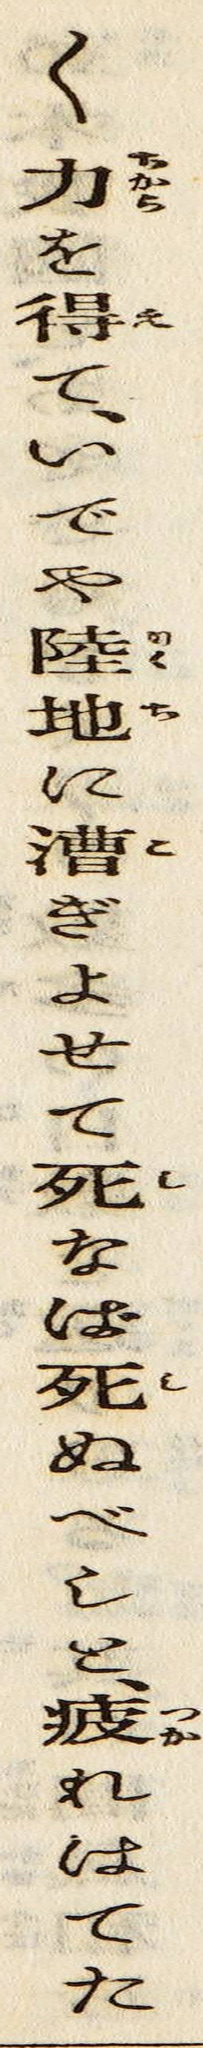〳〵、力を得て、いでや陸地に漕ぎよせて死なば死ぬべしと、疲れはてた
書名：日本漂流譚
